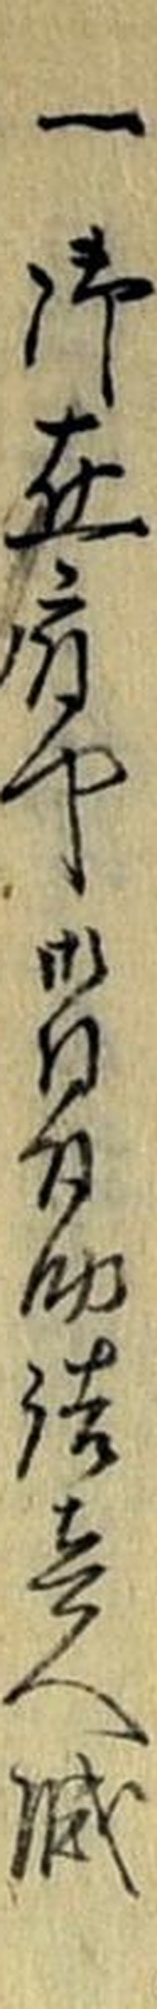一御在府中御目付助詰壱人減
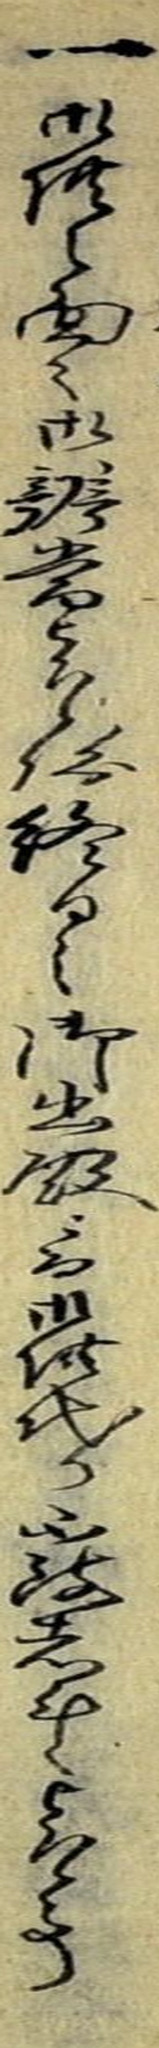一御供之面々御弁当被下候儀終日之御出殿ニ而御供代り不致者斗へ被下候事
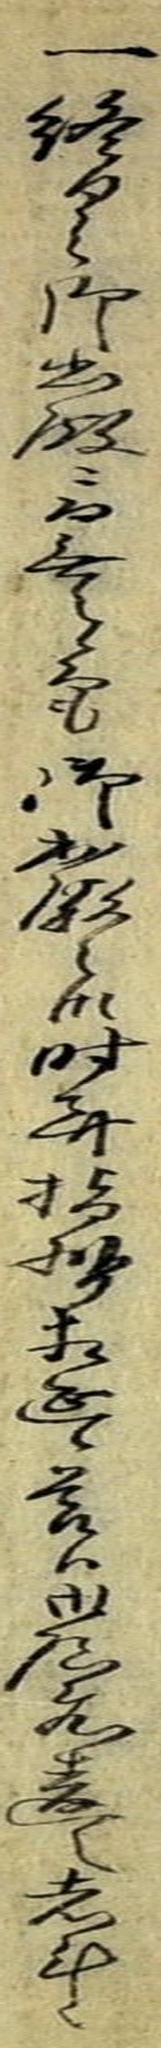一終日之御出殿ニ而無之ニ而も御出殿之御時刻指掛り相延候節ハ御屋敷違之者斗へ
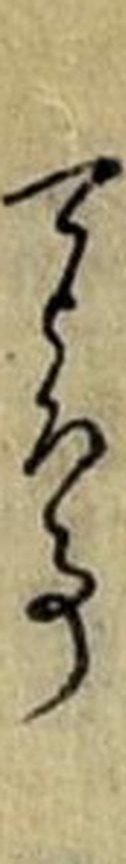可被下事
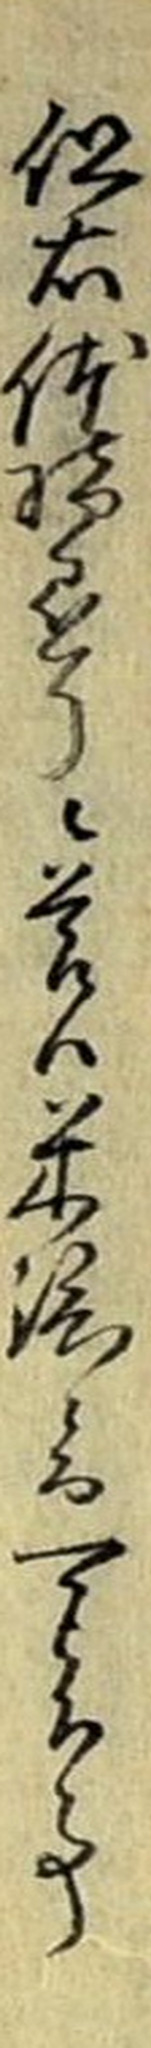但右体指懸り候節ハ米渡ニ而可被下事
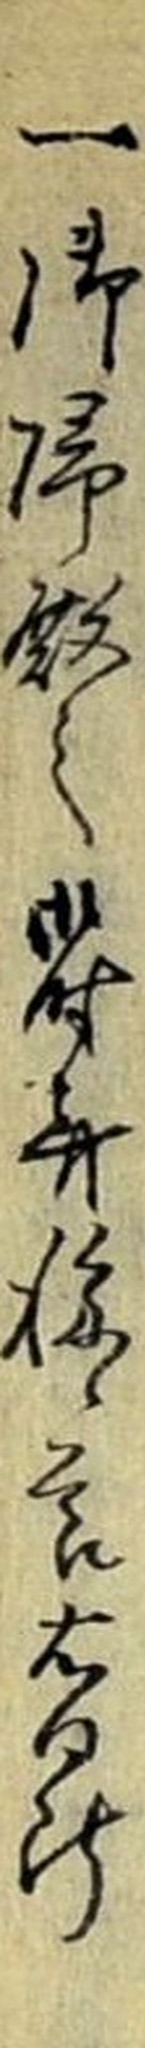一御帰殿之御時刻移候節右同断
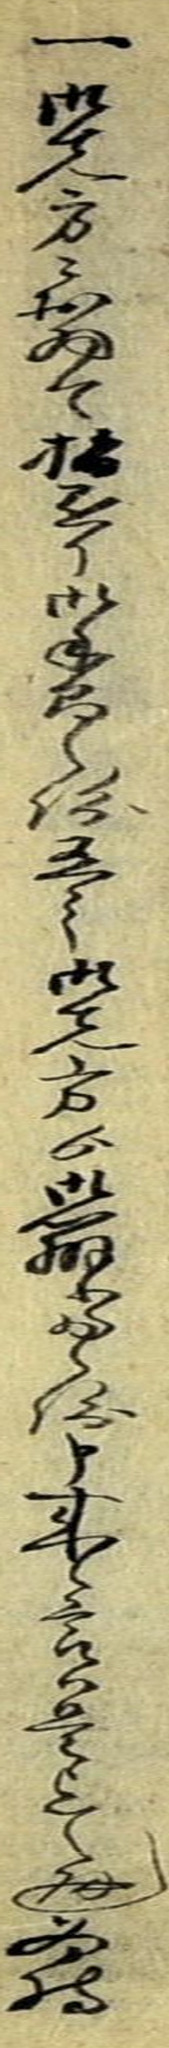一御先方ニおゐて指懸り御手間之儀有之御先方ゟ御弁当之儀申来候節ハ是迄之通為持
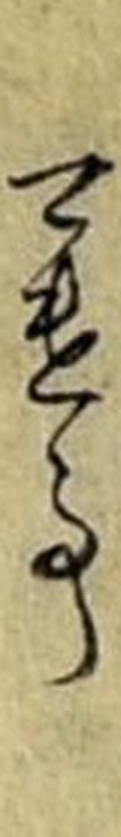可遣事
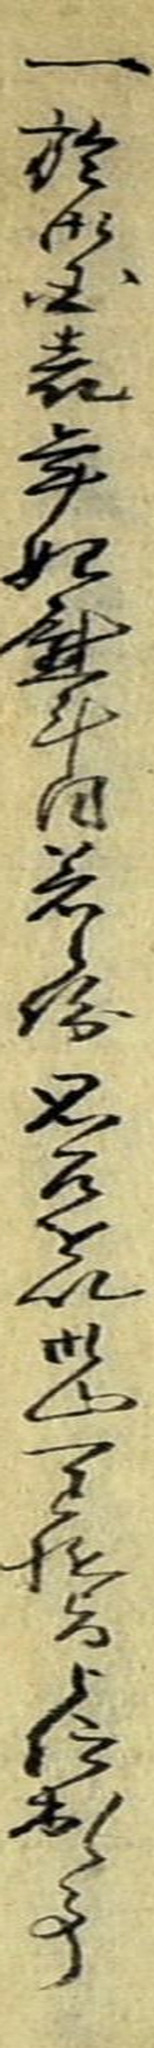一於御国表年始熨斗目着之儀思召を以御止可被遊旨被仰出候事
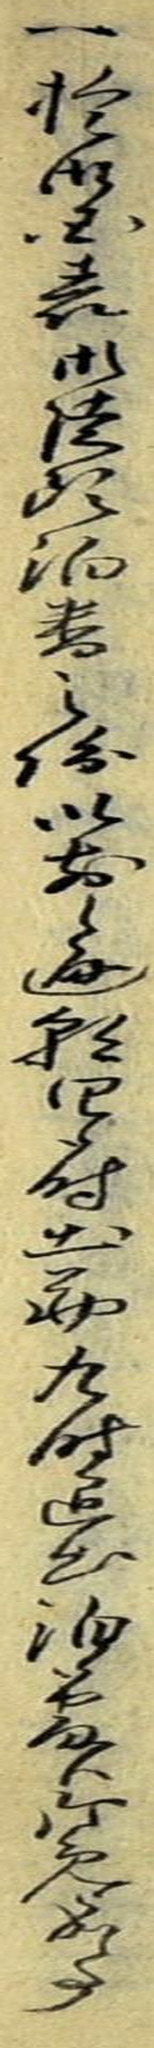一於御国表御徒頭泊番之儀以前之通朝四ツ時出勤九時退出泊御番ハ御免被成候事

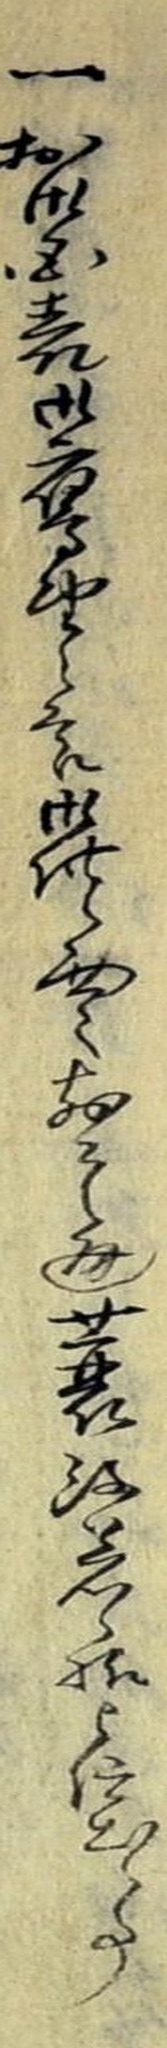一於御国表御鷹野之節御供之面々前々之通蓑致着候様被仰出候事
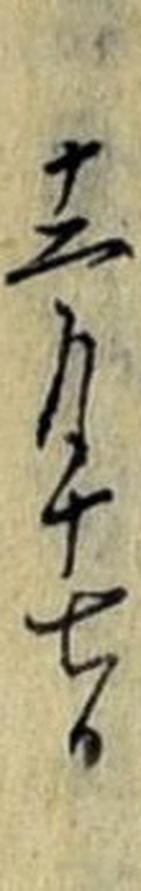十二月十七日
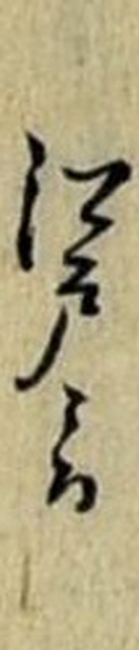江戸ニ而
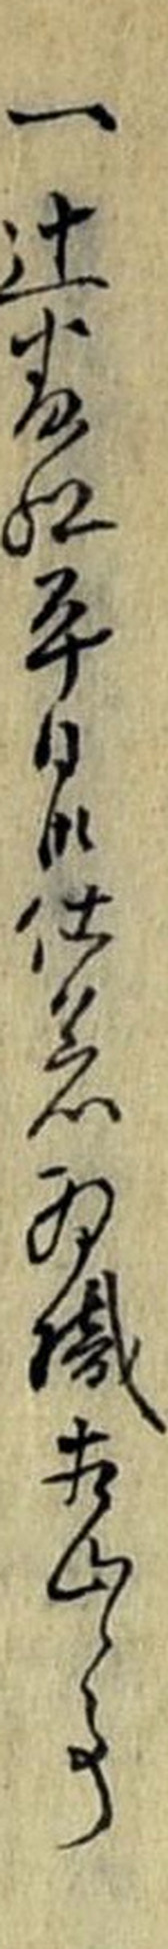一辻番組平日御仕着羽織相止候事
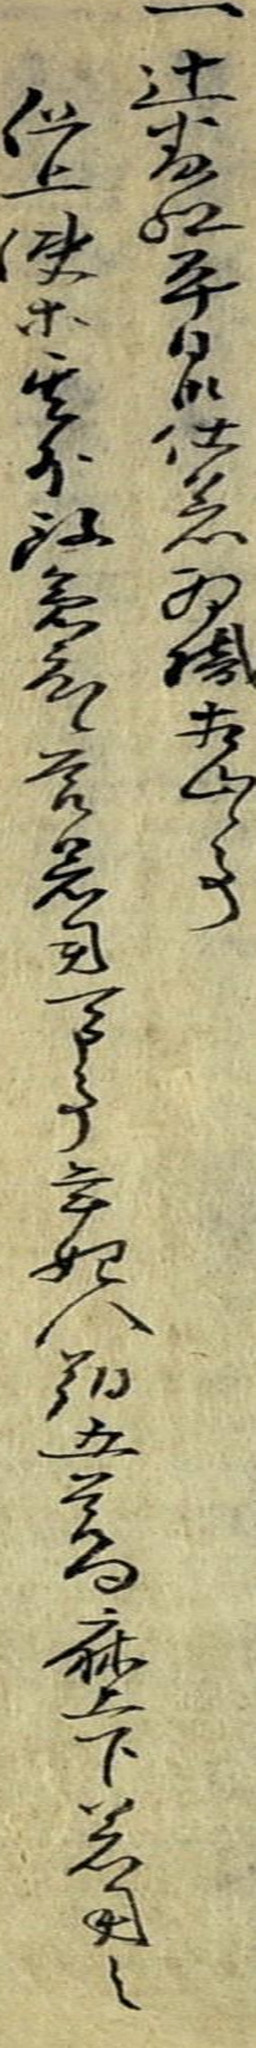但上使等其外致急度候節着用可申事年始八朔五節句麻上下着用之
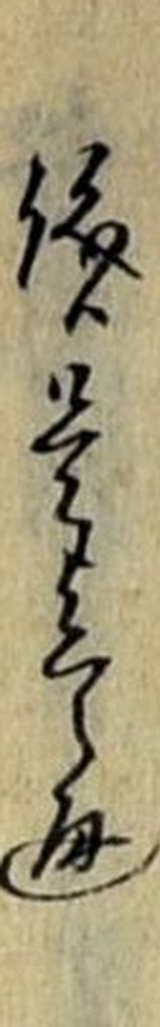儀ハ是迄之通
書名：命令之部 三
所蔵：福井県文書館 Fukui Prefectural Archives
